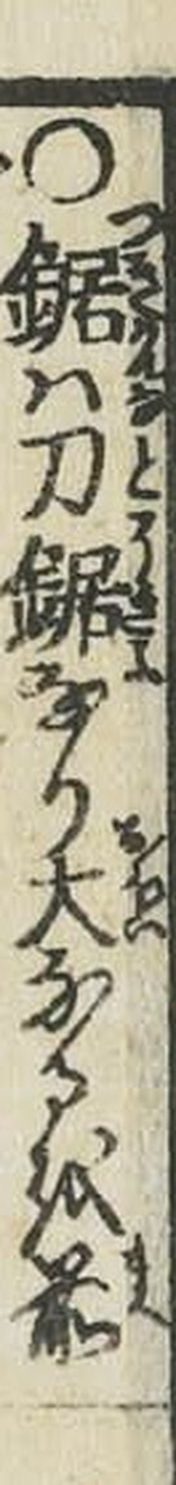○鋸は刀鋸なり大なるを前
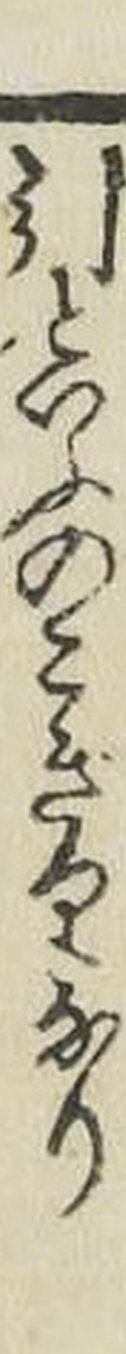引といふのこぎりなり
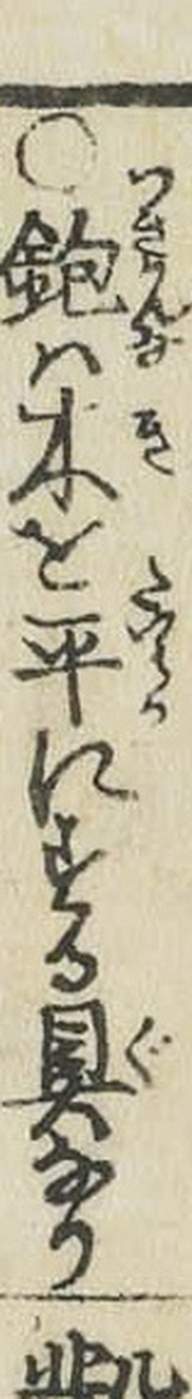○鉋は木を平にする具なり
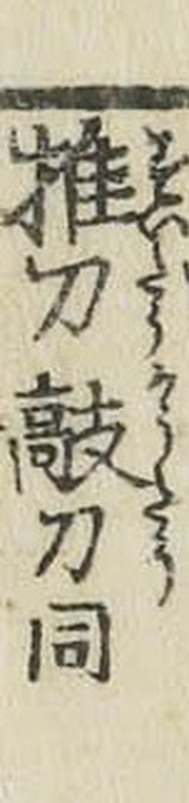推刀敲刀同
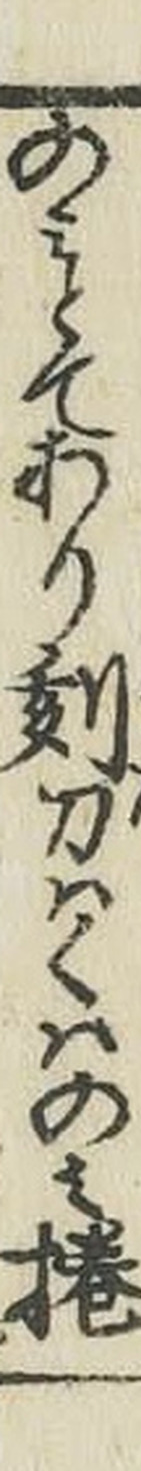のみとてあり刻刀はくはのみ捲
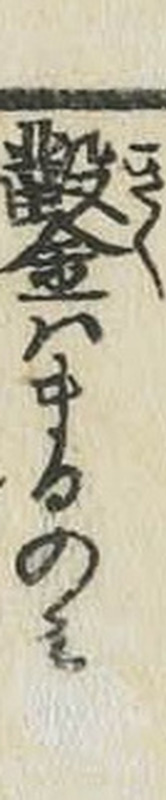鑿はまるのみ
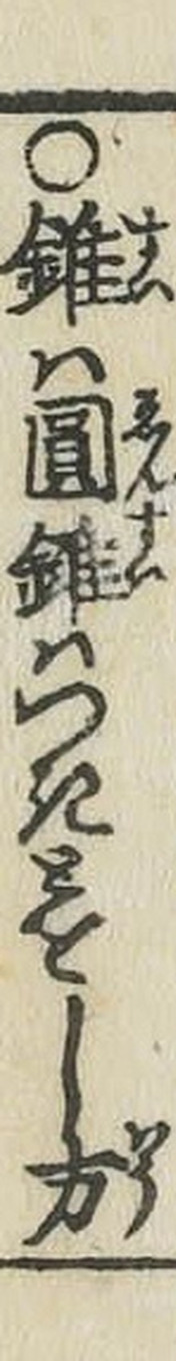○錐は円錐はつきとをし方
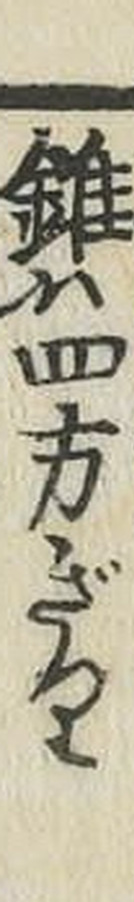錐は四方ぎり
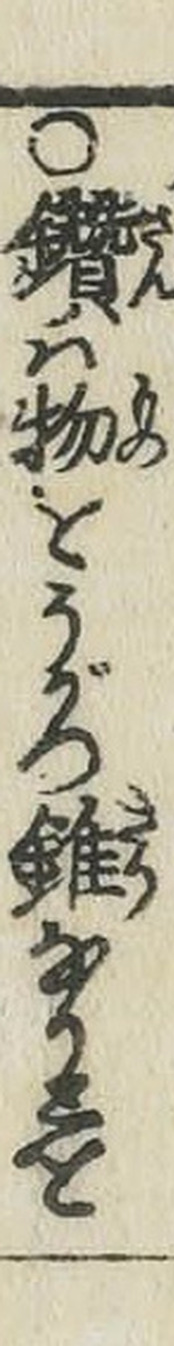○鑽は物をうがつ錐なりとを
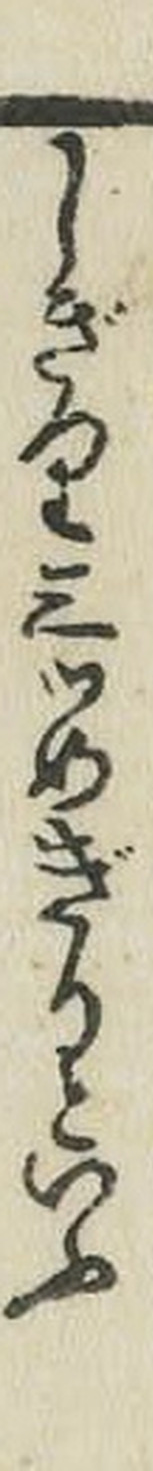しぎり三ツめぎりといふ
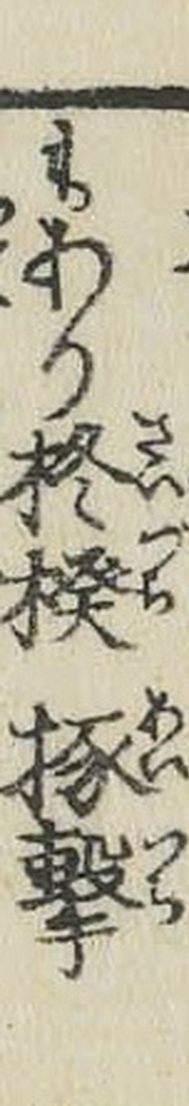もあり柊楑椓撃
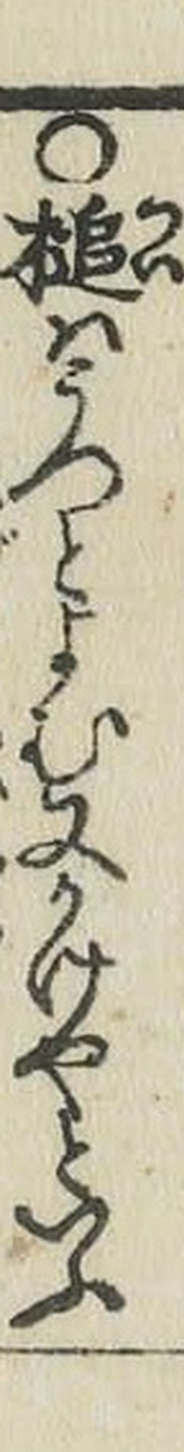○槌はうつとよむ又かけやといふ
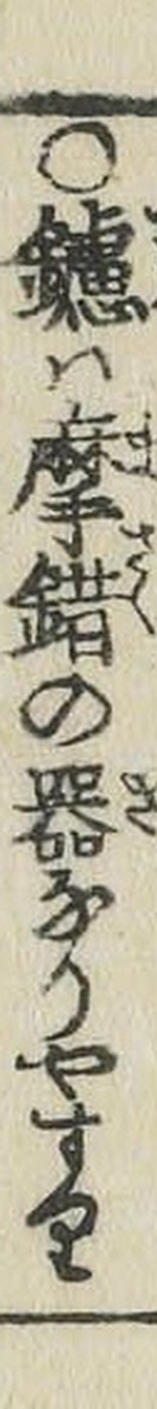○鑢は摩錯の器なりやすり
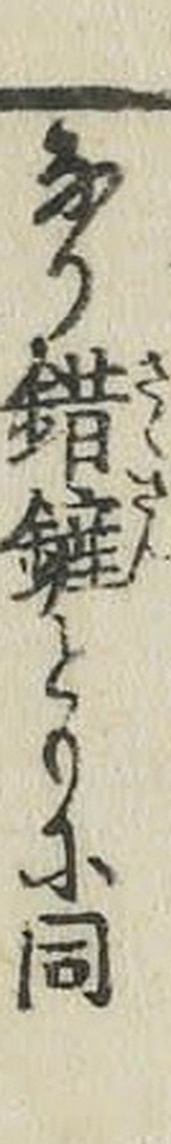なり錯鏟ともに同
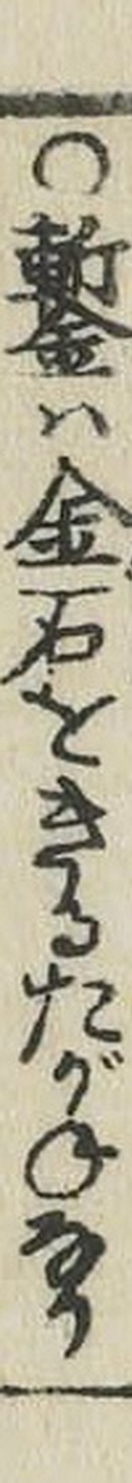○鏨は金石をきるたがねなり

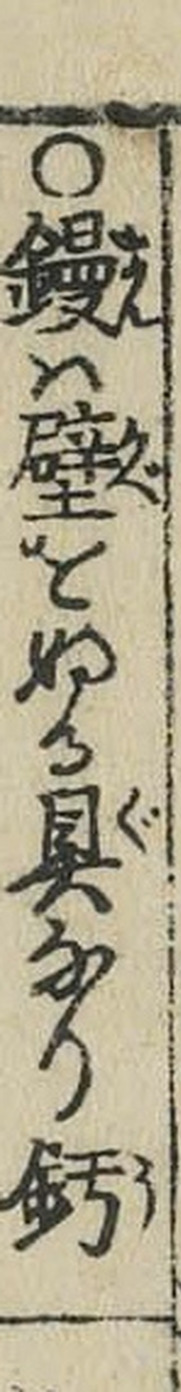○鏝は壁をぬる具なり釫
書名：増補頭書訓蒙図彙大成 10巻 5:巻之9-11
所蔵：東京学芸大学教育コンテンツアーカイブ
